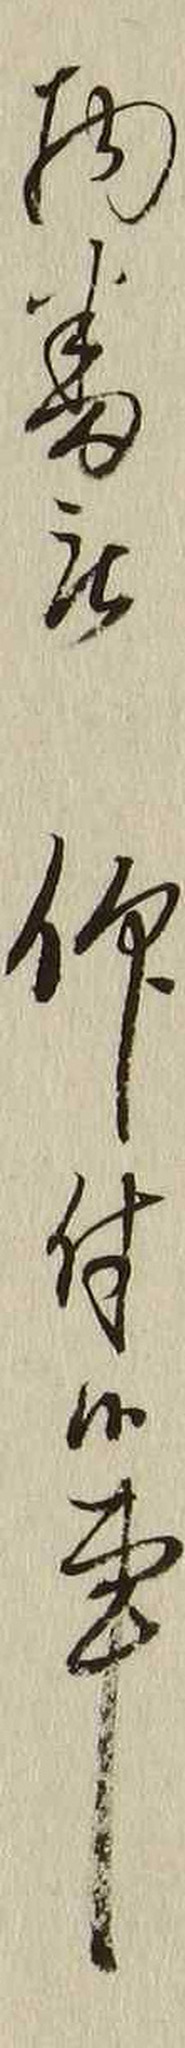物番被仰付候事
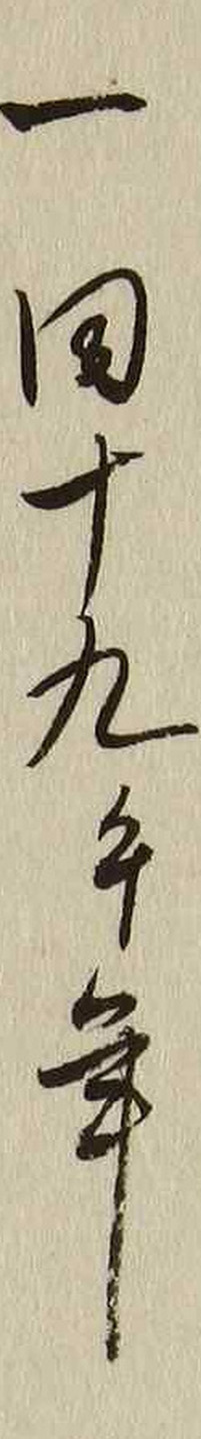一同十九午年
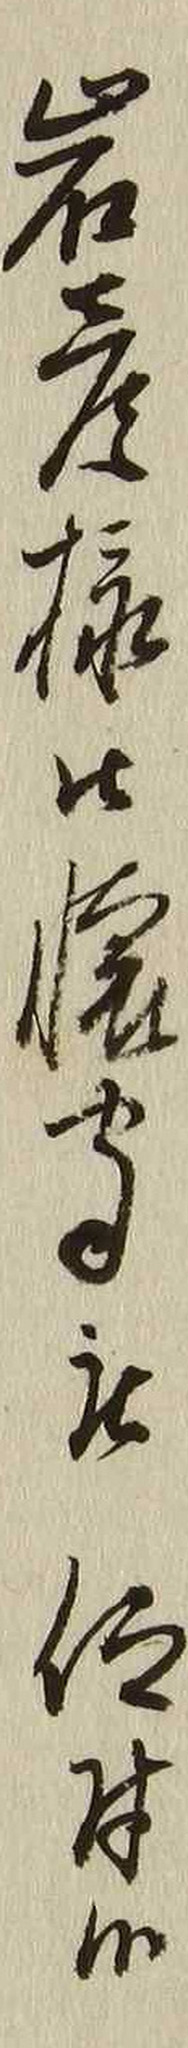岩彦様御懐守被仰付候
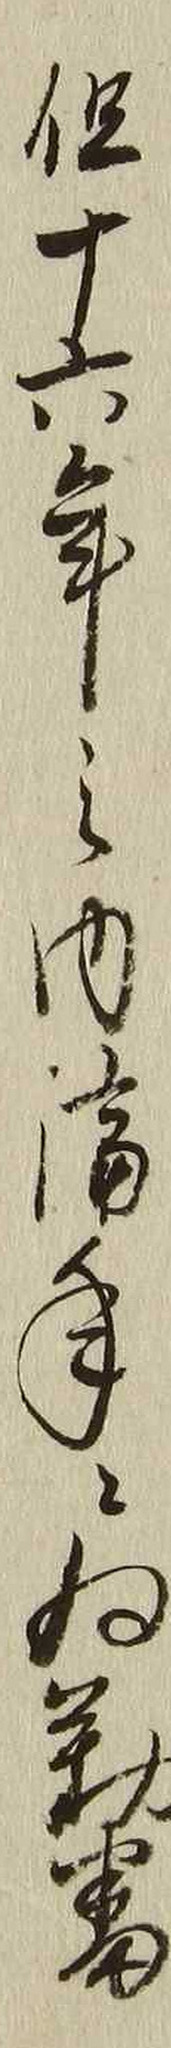但十六年之内隔年ニ為勤番
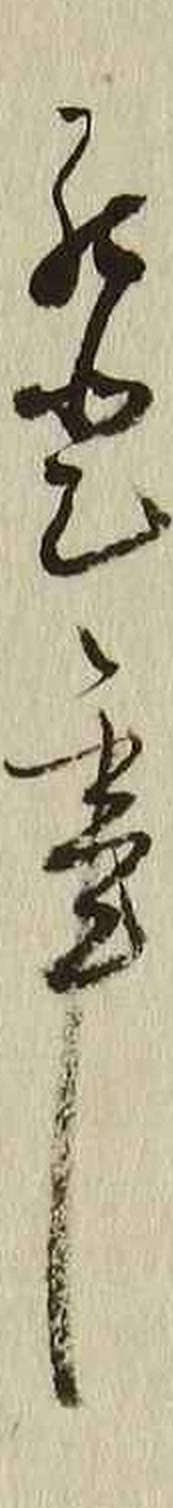罷登候事
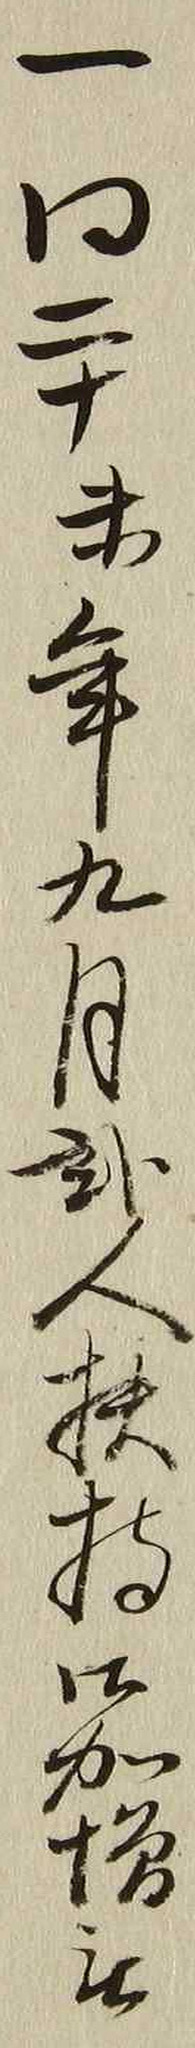一同二十未年九月弐人扶持御加増被
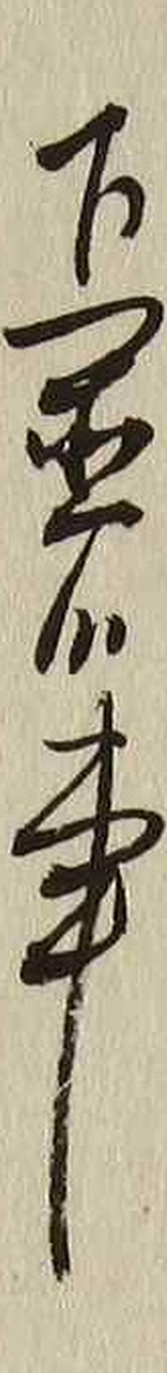下置候事
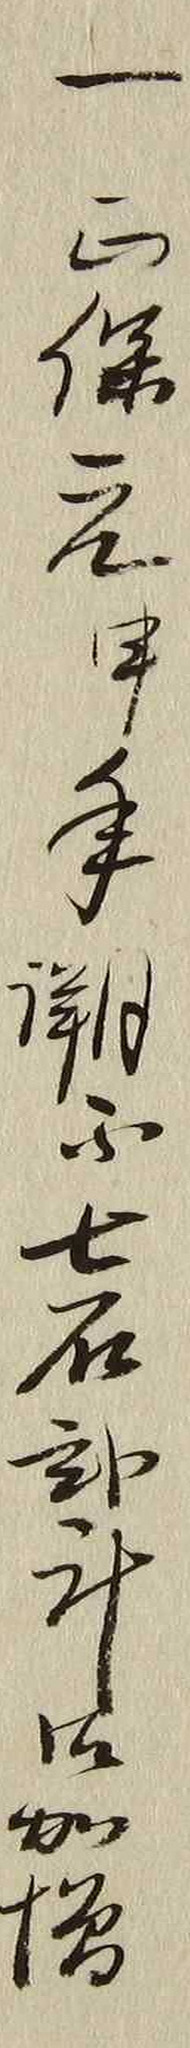一正保元申年月不詳七石弐斗御加増
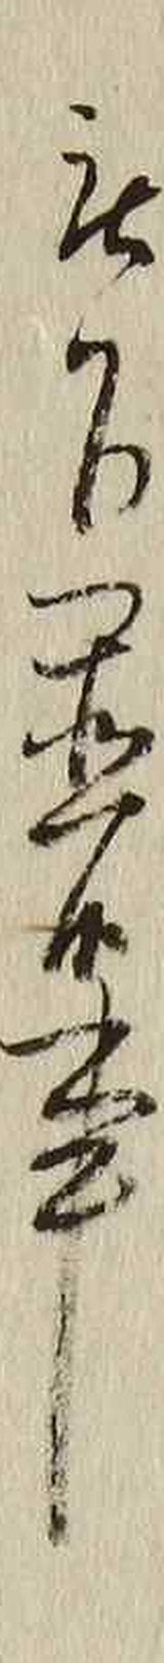被下置候事
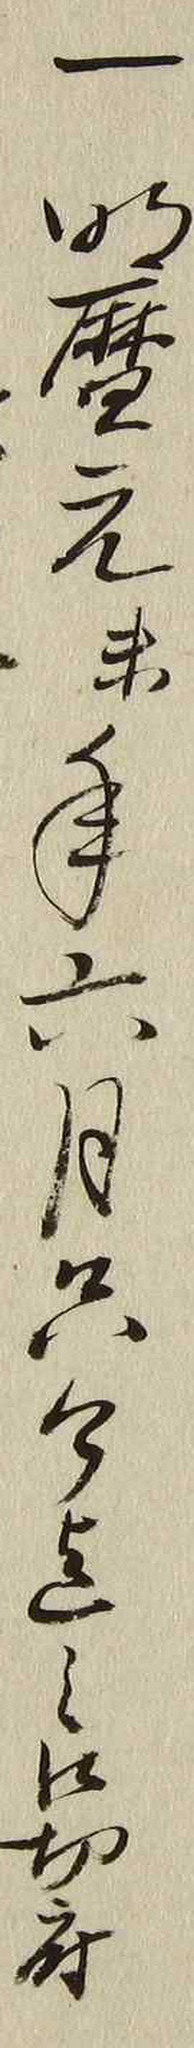一明麿元未年六月只今迄之御切府
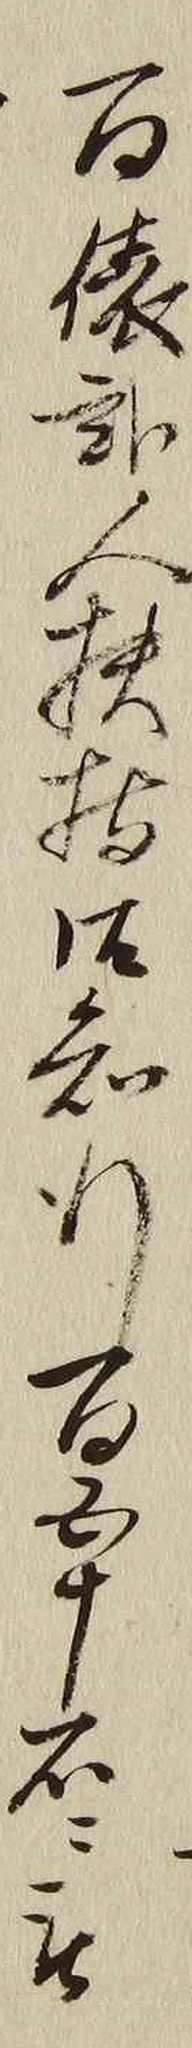百俵弐人扶持御知行百五十石ニ被
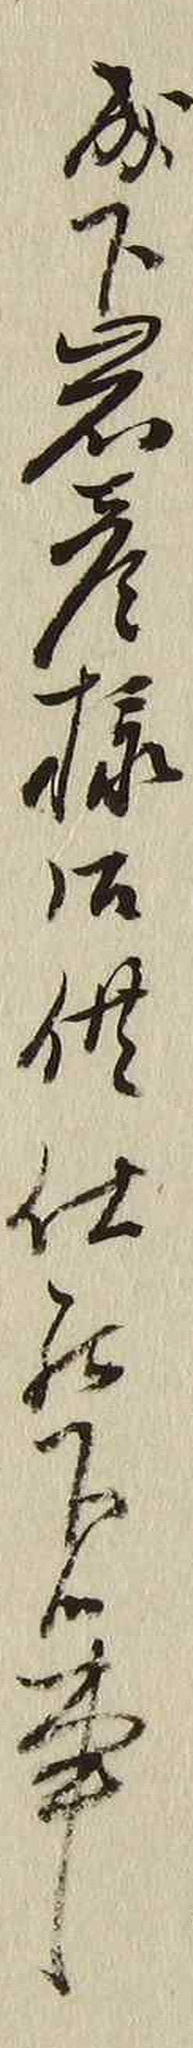成下岩彦様御供仕罷下候事
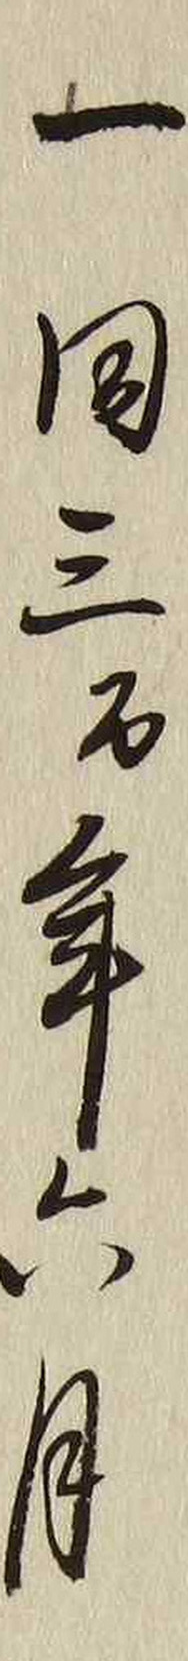一同三酉年六月
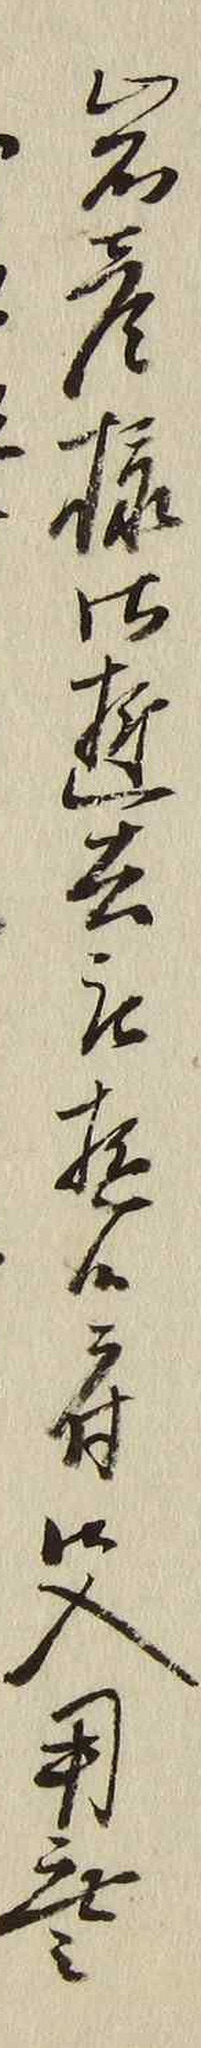岩彦様御逝去被遊候ニ付御入用無之
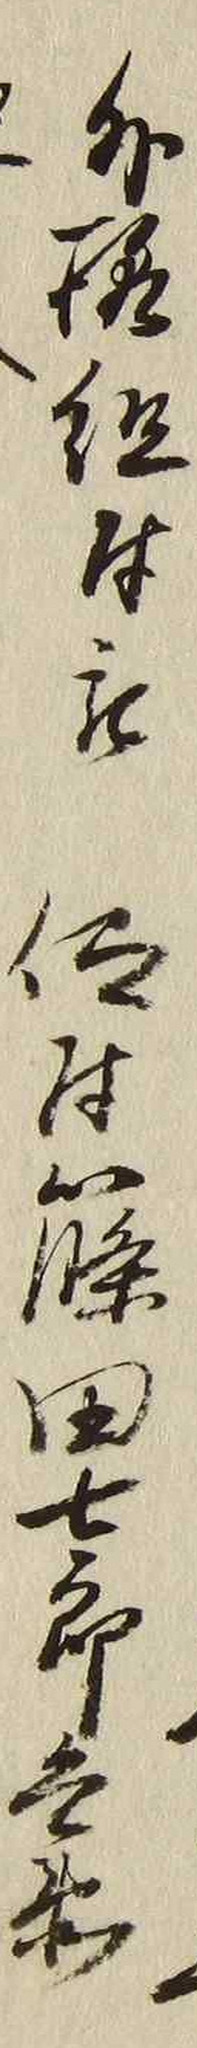外様組付被仰付篠田七郎兵衛
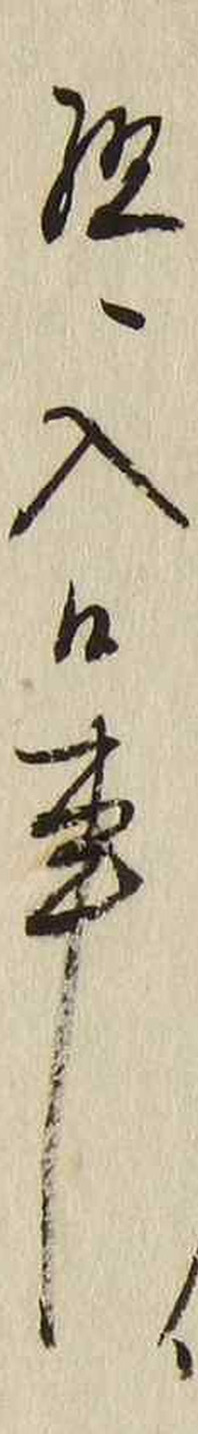組へ入候事
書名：諸士系譜　巻之348　も之部4
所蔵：会津若松市立会津図書館
